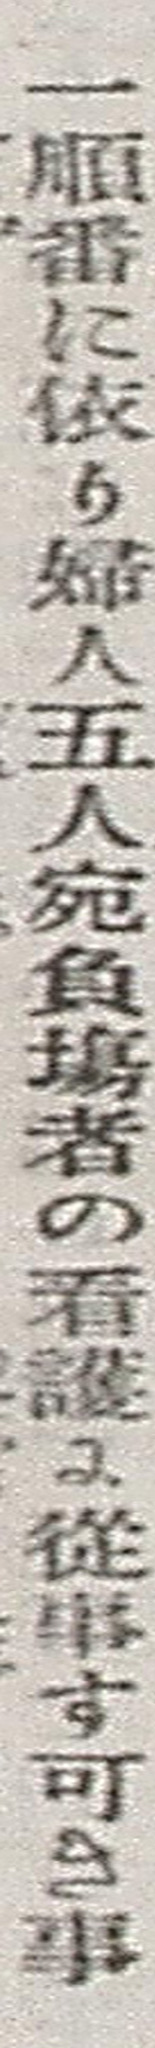一順番に依り婦人五人宛負傷者の看護に従事す可き事
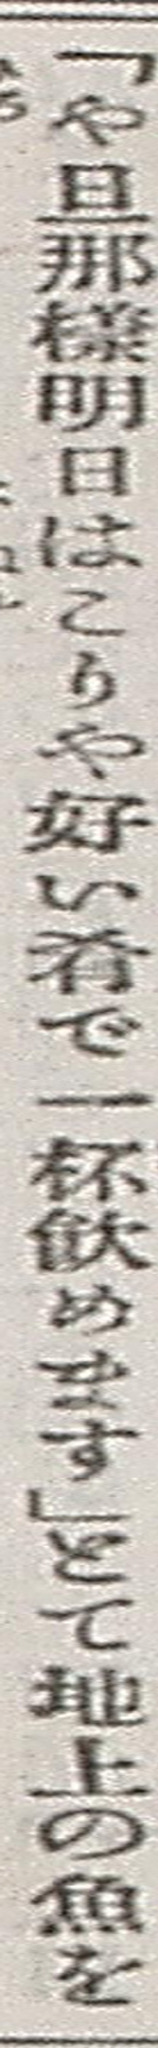「や旦那様明日はこりや好い肴で一杯飲めます」とて地上の肴を
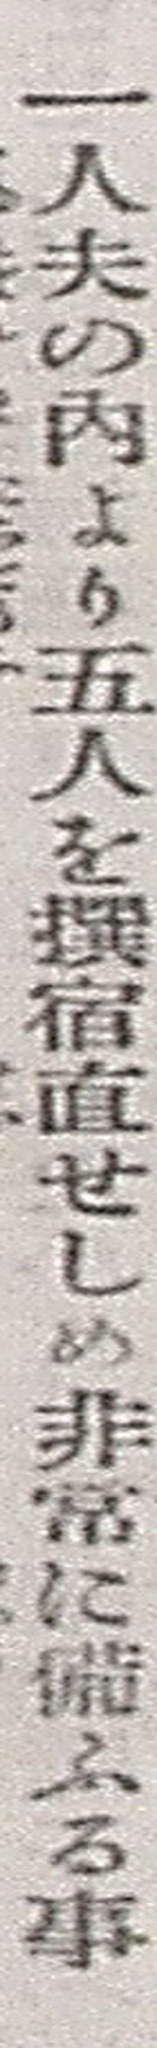一人夫の内より五人を選宿直せしめ非常に備ふる事
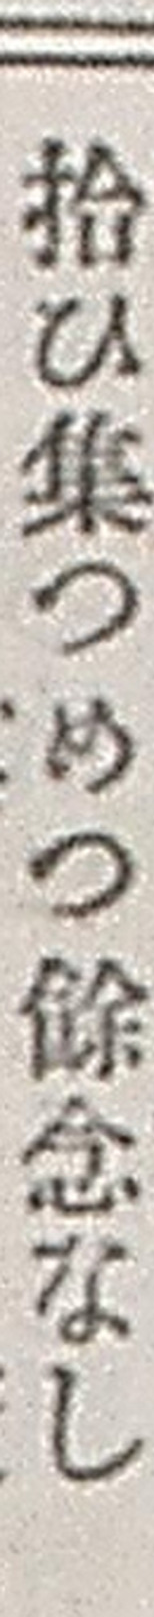拾ひ集つめつ余念なし
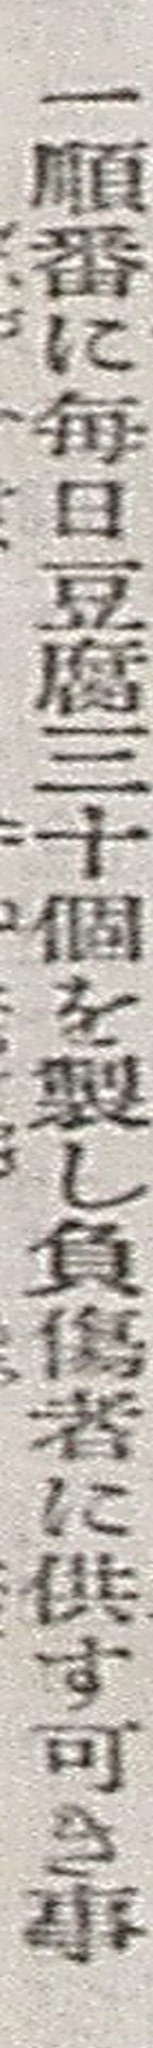一順番に毎日豆腐三十個を製し負傷者に供す可き事
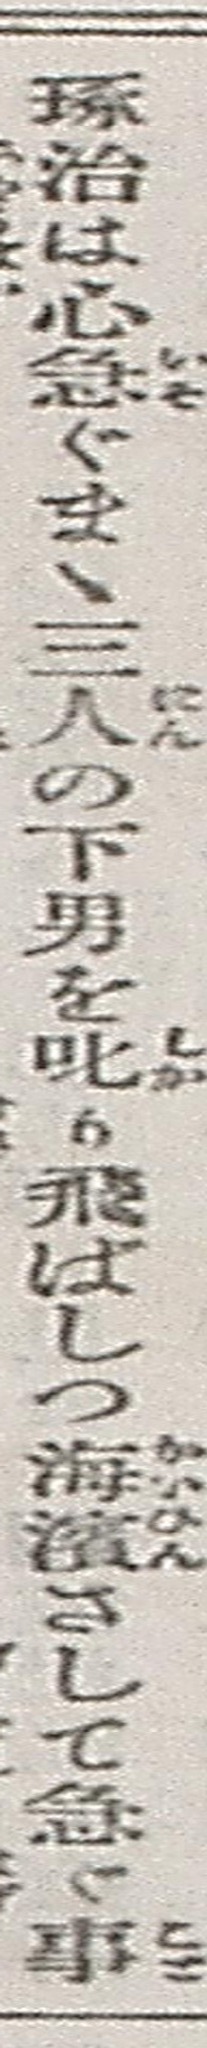琢治は心急ぐまゝ三人の下男を叱り飛ばしつ海浜さして急ぐ事
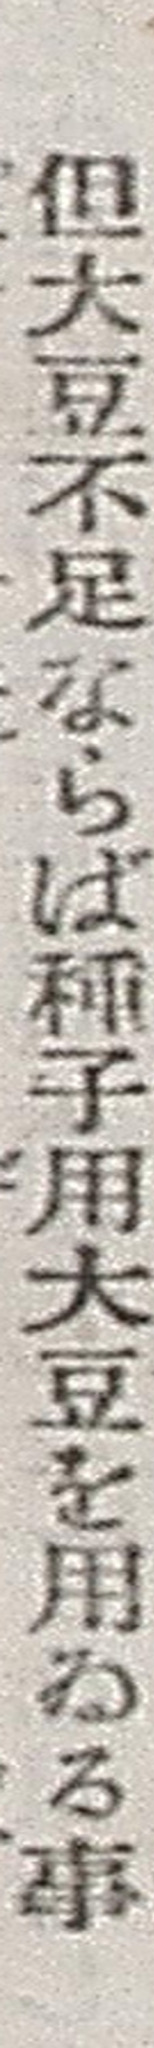但大豆不足ならば種子用大豆を用ゐる事
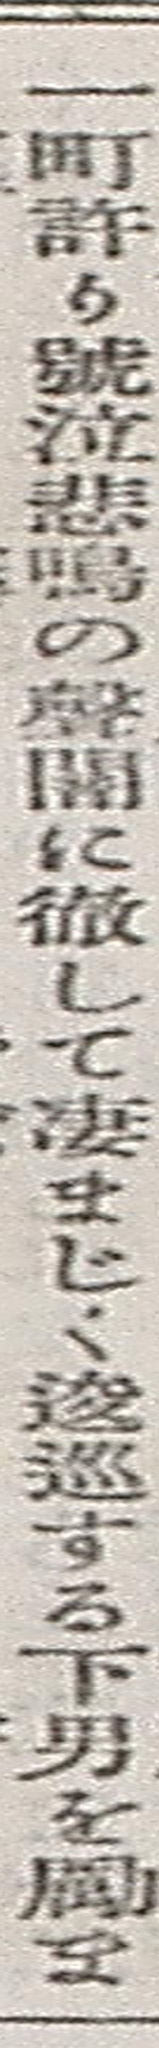一町許り号泣悲鳴の声闇に徹して凄まじく逡巡する下男を励ま
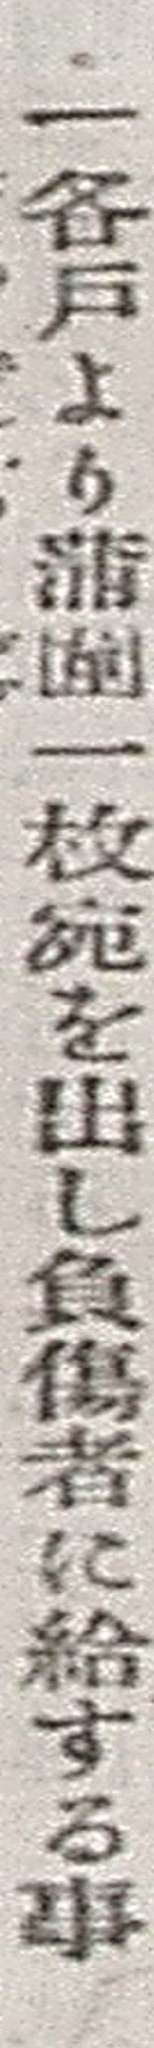一各戸より蒲団一枚宛を出し負傷者に給する事
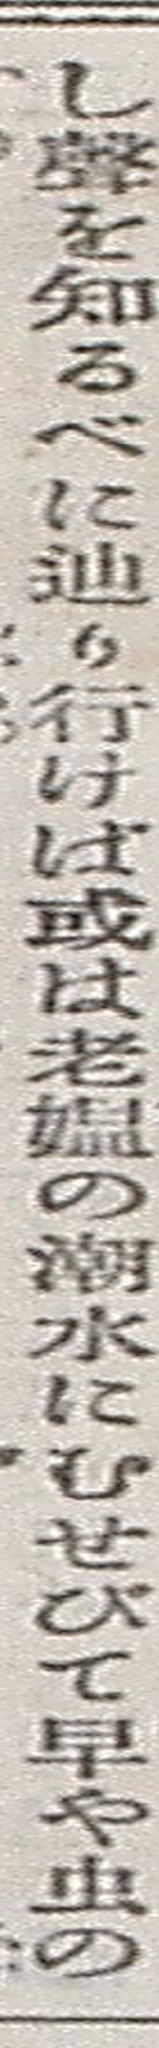し声を知るべに辿り行けば或は老媼の潮水にむせびて早や虫の
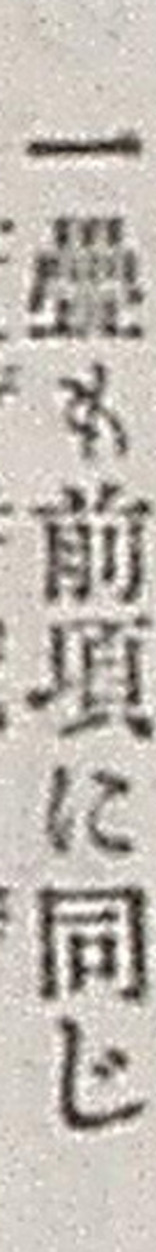一畳も前項に同じ
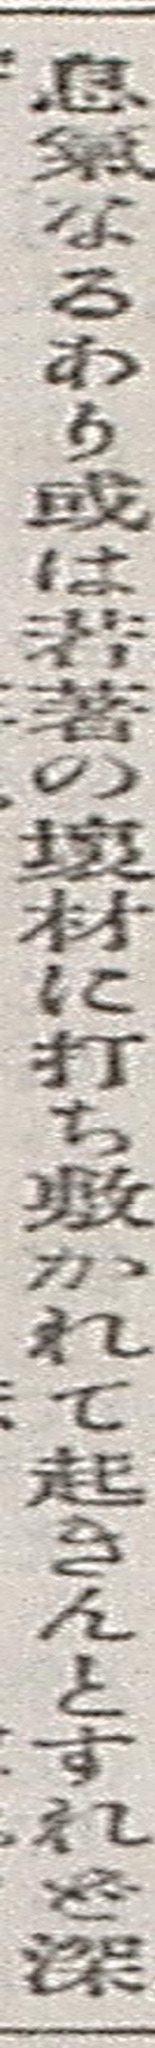息気なるあり或は若著の壊材に打ち敷かれて起きんとすれど深
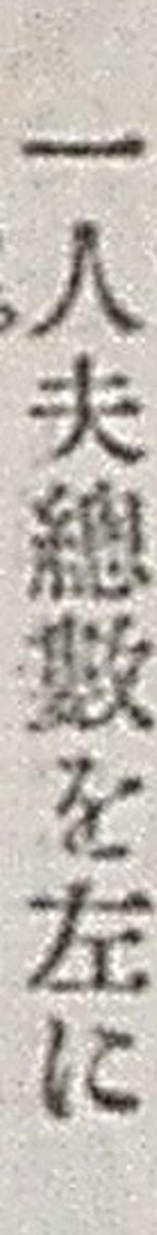一人夫総数を左に
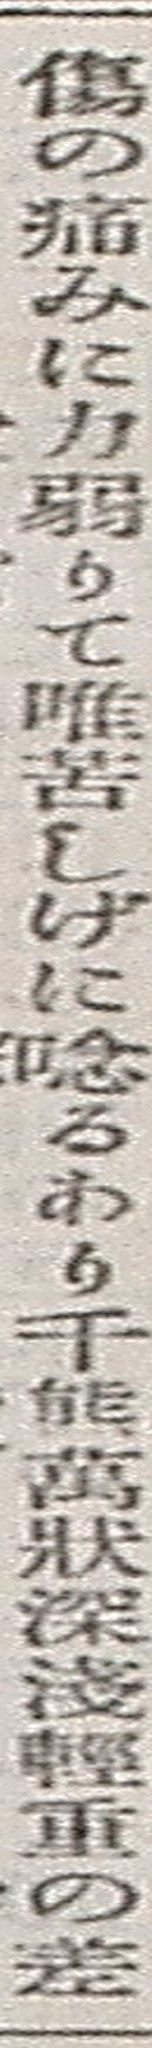傷の痛みに力弱りて唯苦しげに唸るあり千態万状深浅軽重の差
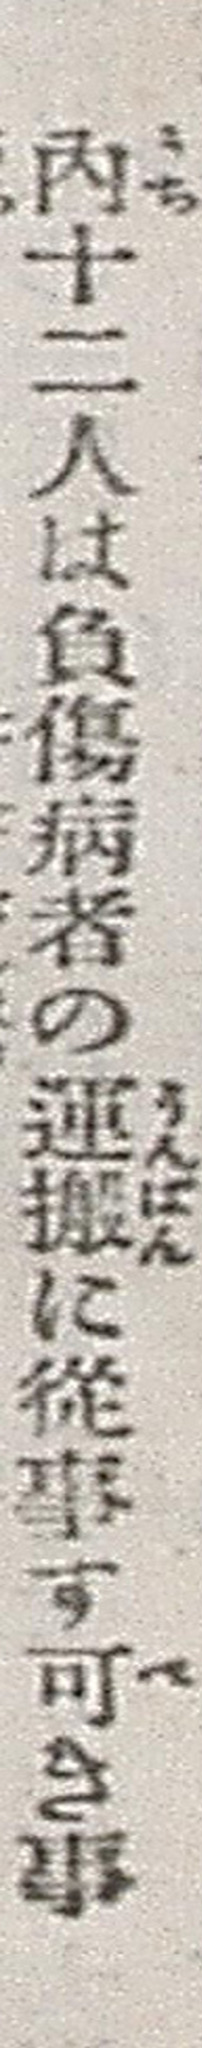内十二人は負傷病者の運搬に従事す可き事
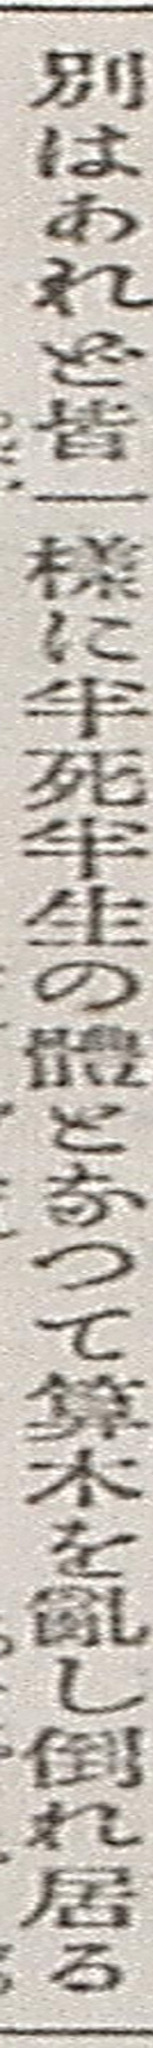別はあれど皆一様に半死半生の体となつて算木を乱し倒れ居る
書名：風俗畫報臨時増刊第百二十號　大海嘯被害録（下）
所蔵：東京大学地震研究所図書室 Earthquake Research Institute Library, The University of Tokyo, JAPAN
